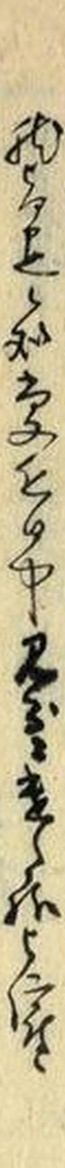然旨申上候処尚又近日中見分ニ遣候様被仰付候
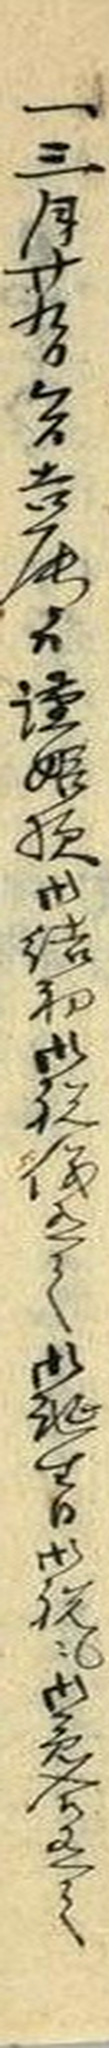一三月廿九日今日吉辰ニ付謹姫様御結初御祝儀有之御誕生日御祝も御兼合有之
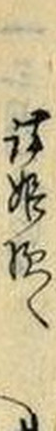謹姫様へ
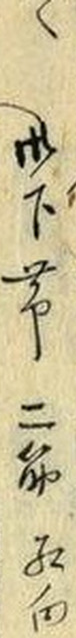御下帯二筋紅白
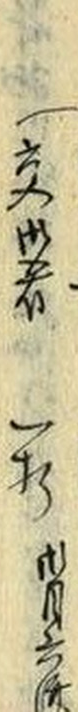交御肴一折右同断
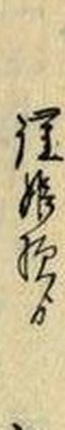謹姫様ゟ
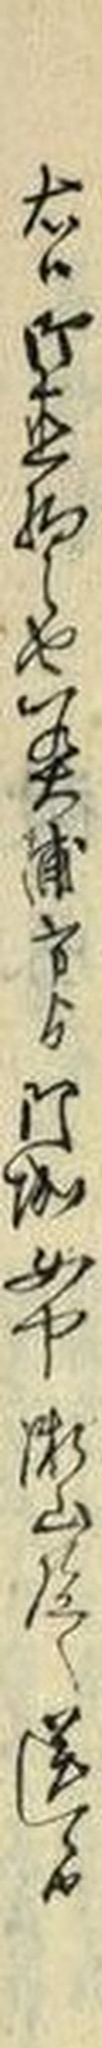右ハ御直約之由関浦方ゟ御城女中瀬山殿へ送候由
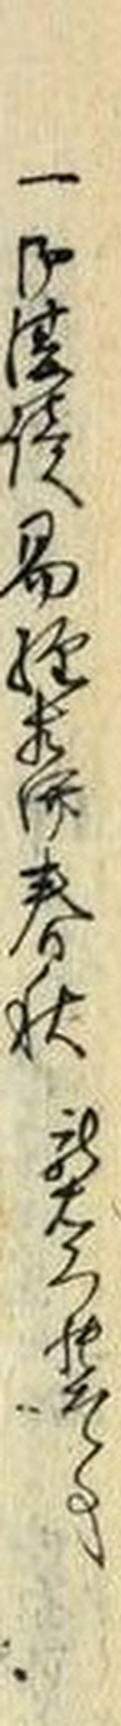一御復読易経相済春秋新右衛門罷出候事
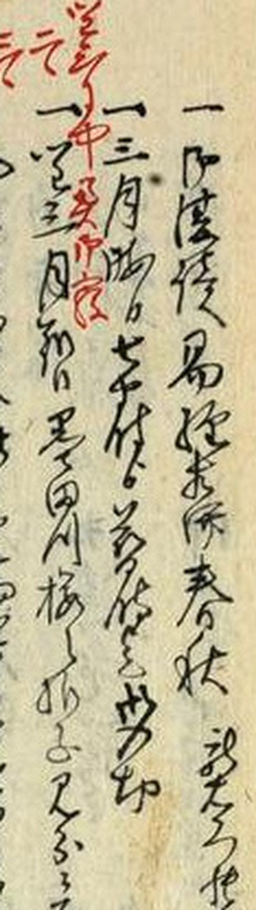一三月晦日七半時ゟ暮時迄御〆切
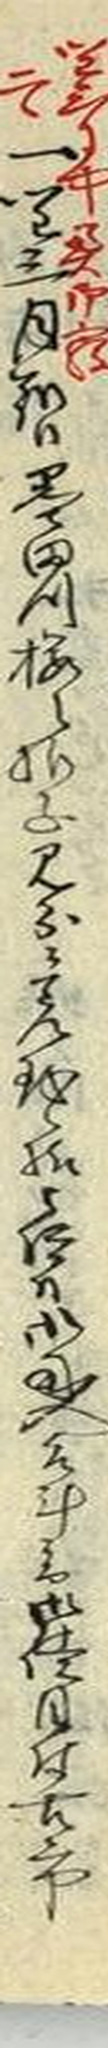一閏三月朔日墨田川桜之様子見分ニ差越候様被仰付御用人取斗ニ而御徒目付古市
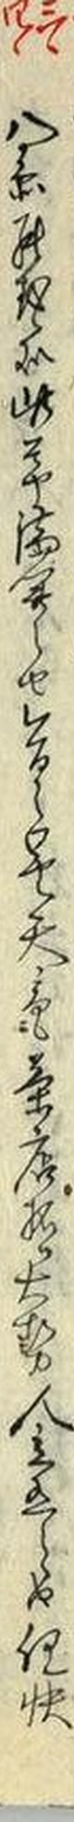八兵衛罷越候処此節満開之由今日之曇天ニ而も茶店抔ハ大勢人立有之由但快
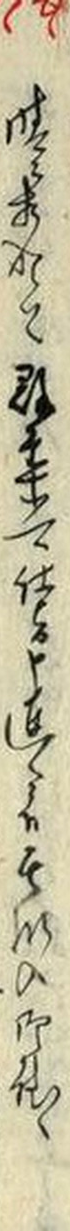晴ニ相成候ハゝ群集可仕旨申達候ニ付其段入御聴候
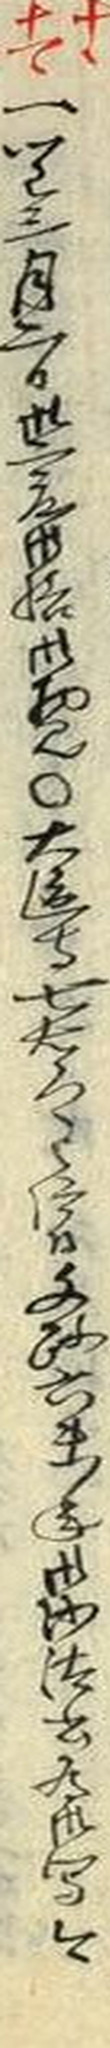一閏三月二日御二度御膳御物見〇大道寺七右衛門へ被仰付文政六未年御沙汰書為写今
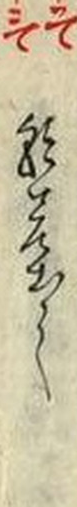朝差出之
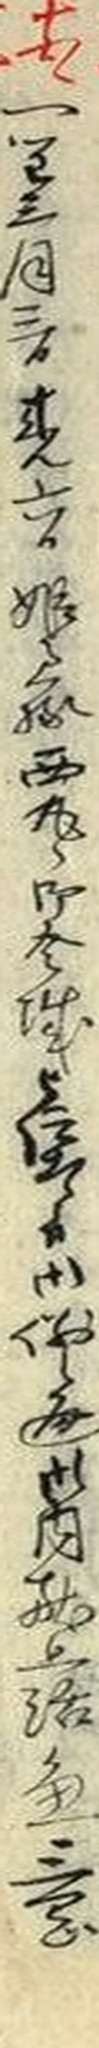一閏三月三日来ㇽ六日姫君様西丸へ御登城被仰出候ニ付御例之通御内献上活魚三岡
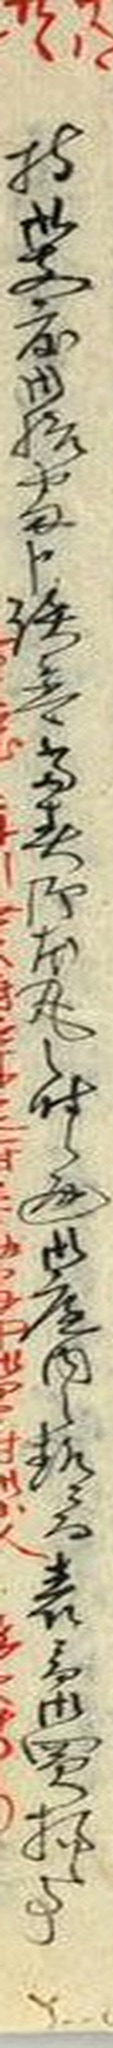持御支度御膳番申談置候当春御本丸之時之通御庭内之趣ニ而表ニ而御買揚候事
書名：少傅日録抄（斉承付側向頭取日記、在府）
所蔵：福井県文書館 Fukui Prefectural Archives
